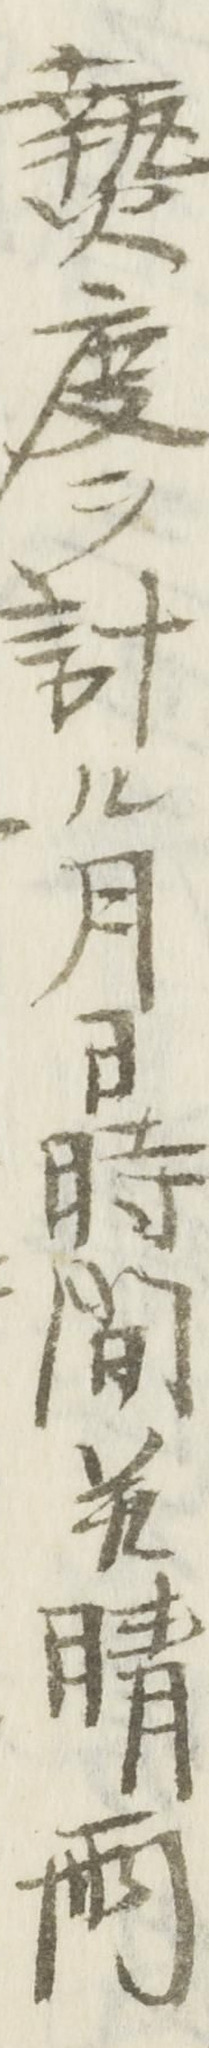熱度ヲ計ル月日時間並晴雨
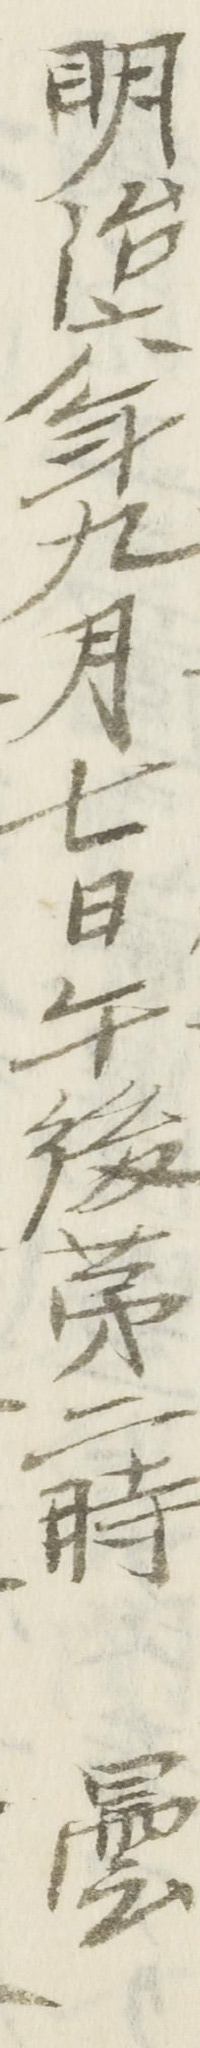明治六年九月七日午後第二時曇
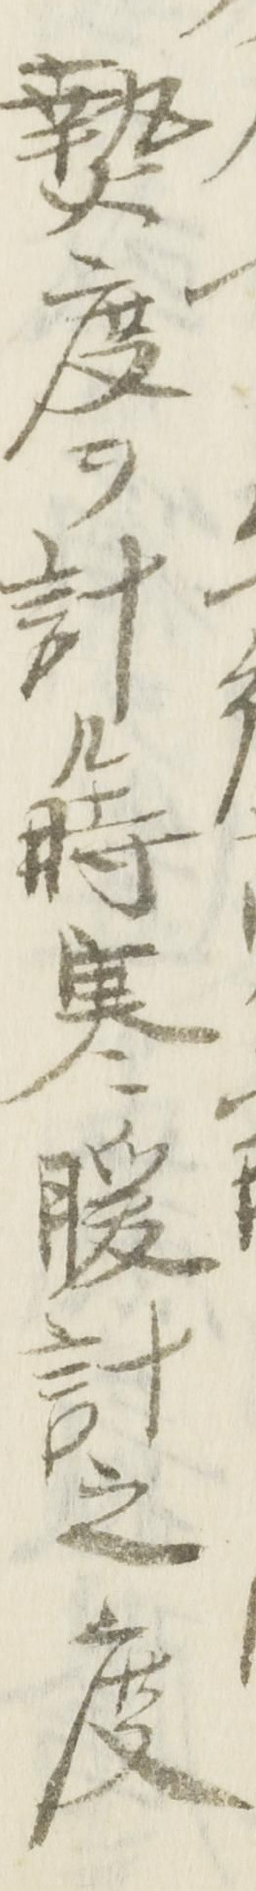熱度ヲ計ル時寒暖計之度
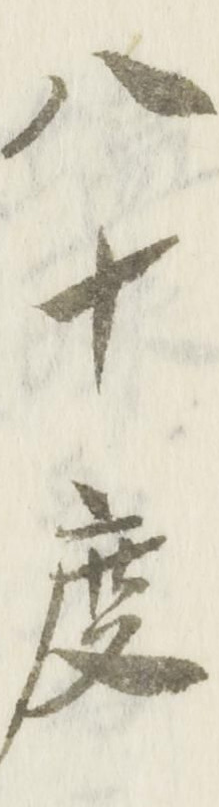八十度
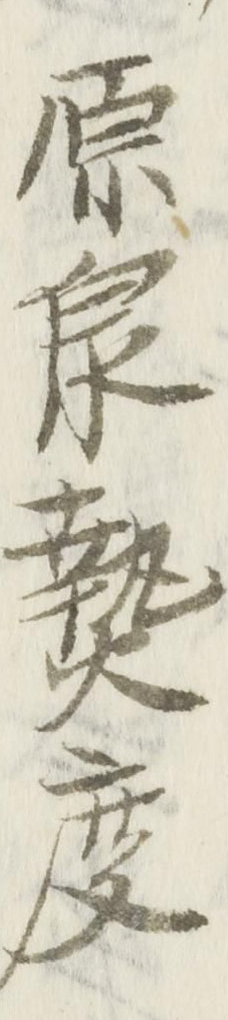原泉熱度
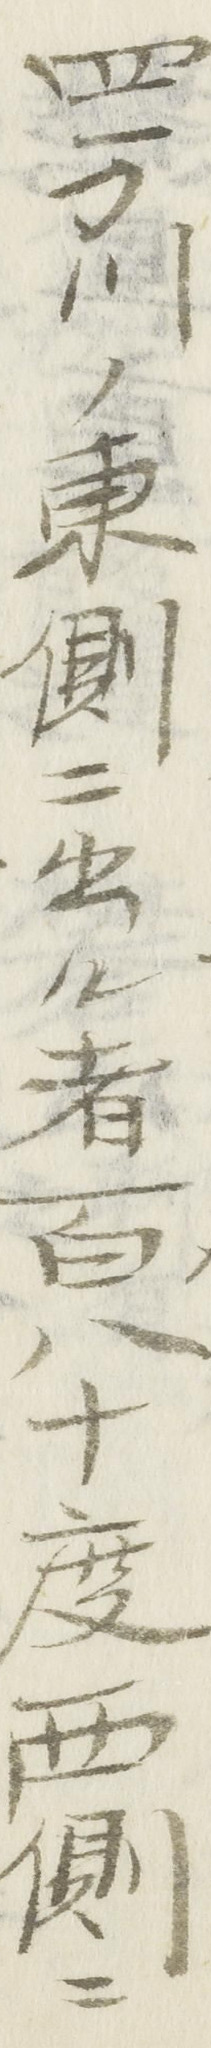四万川ノ東側ニ出ル者百八十度西側ニ
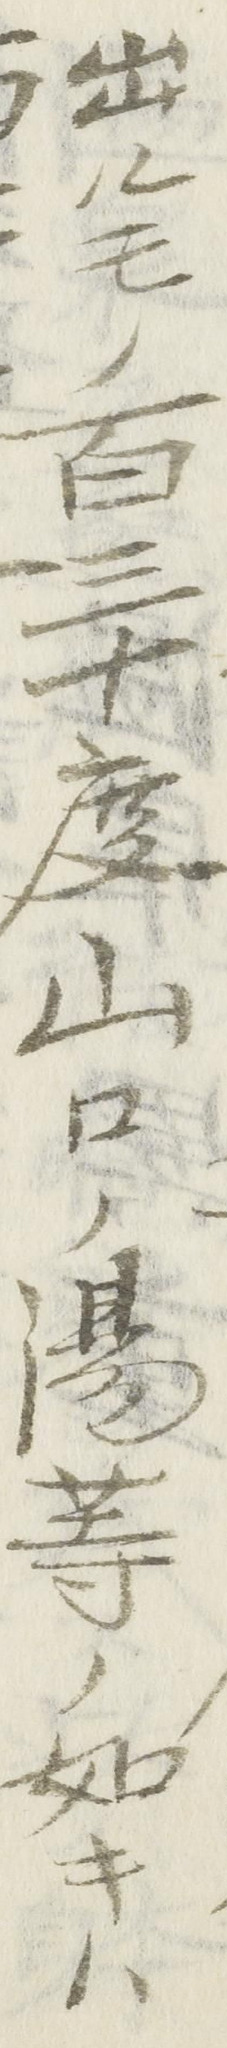出ルモノ百三十度山口ノ湯等ノ如キハ
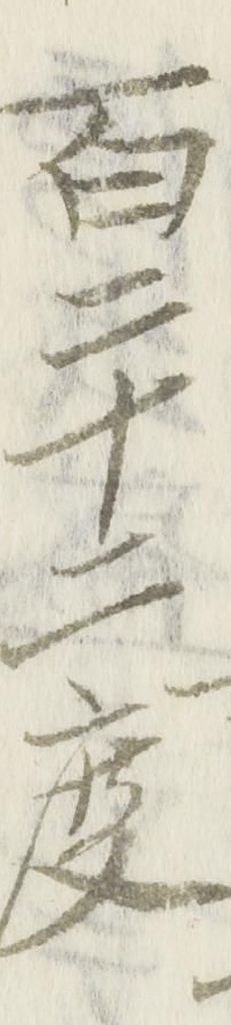百二十二度
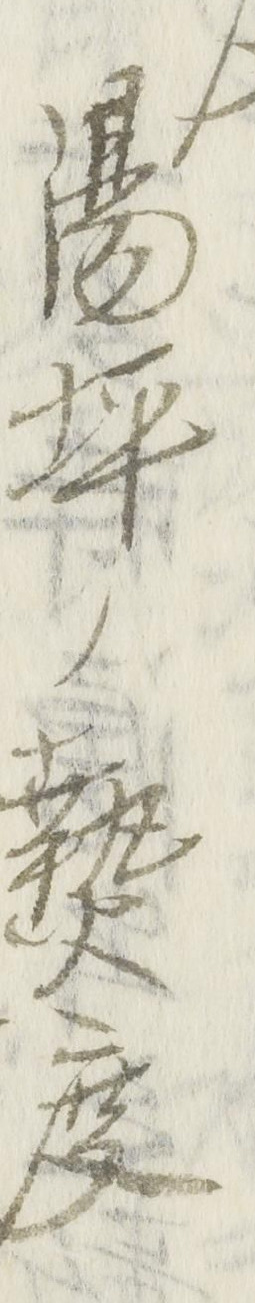湯坪ノ熱度
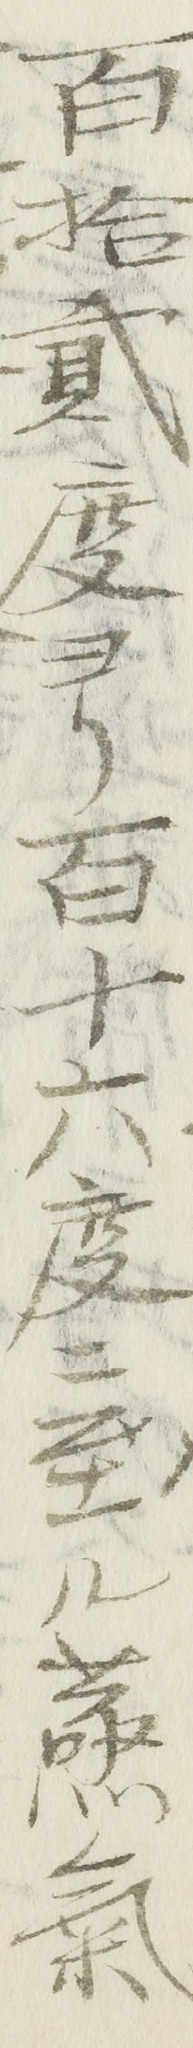百拾貳度ヨリ百十六度ニ至ル蒸気
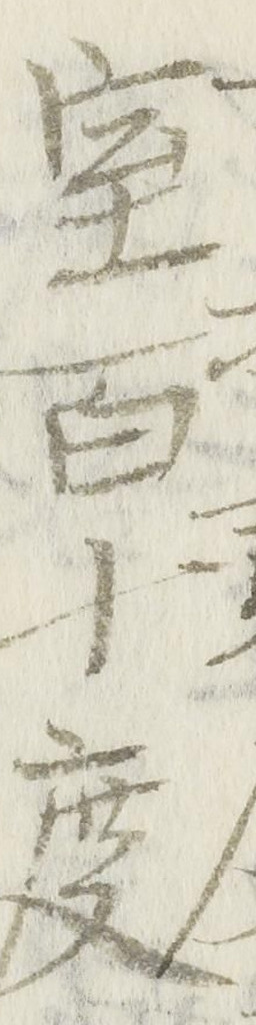室百十度
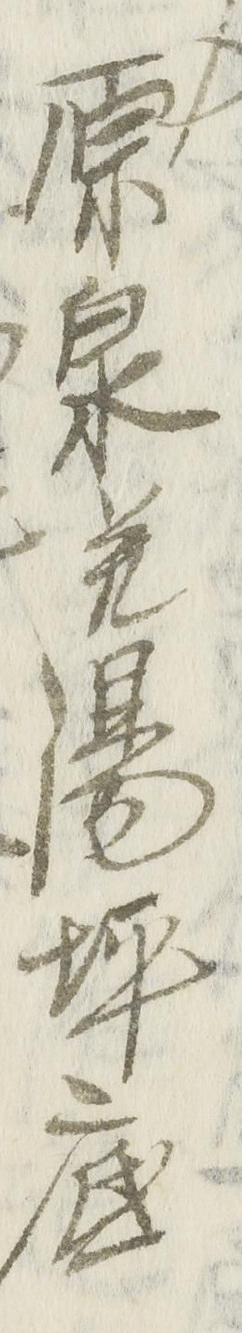原泉並湯坪底
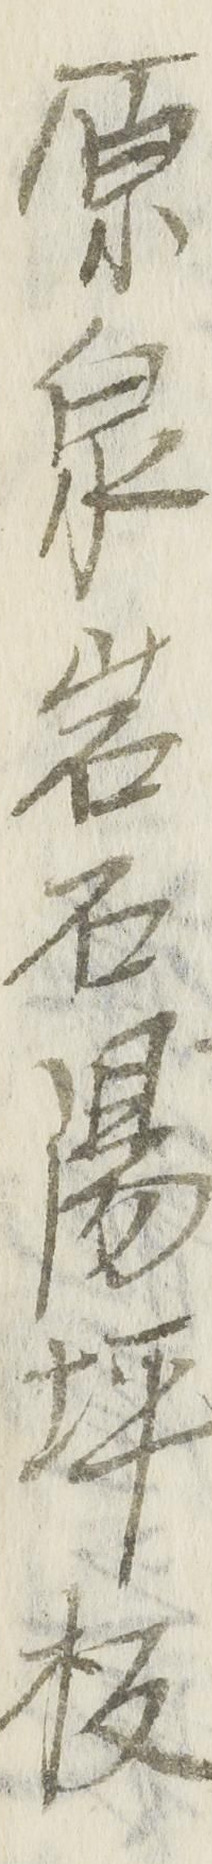原泉岩石湯坪板

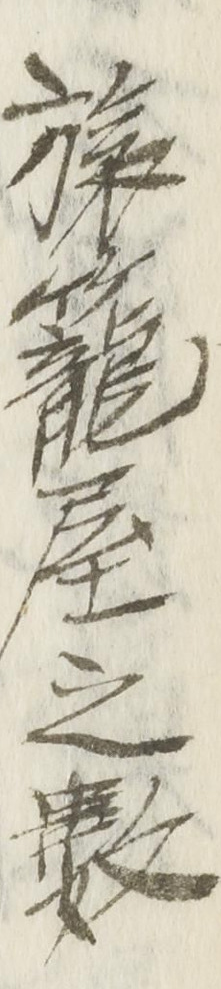旅籠屋之数
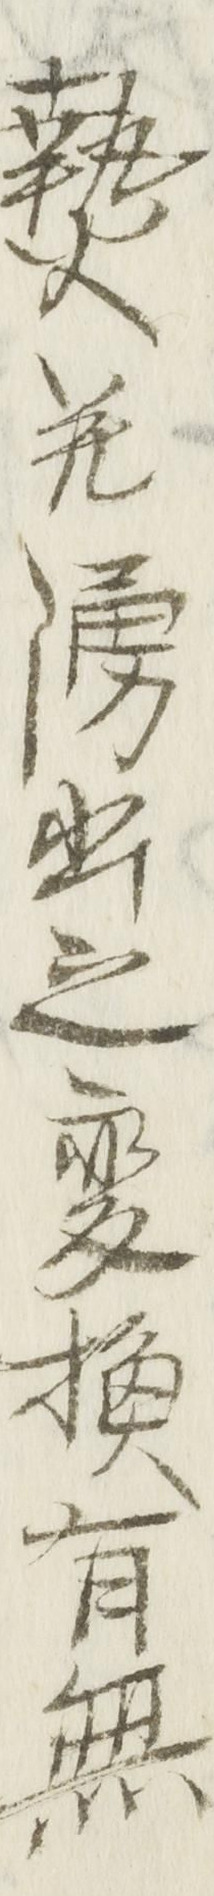熱并湧出之変換有無
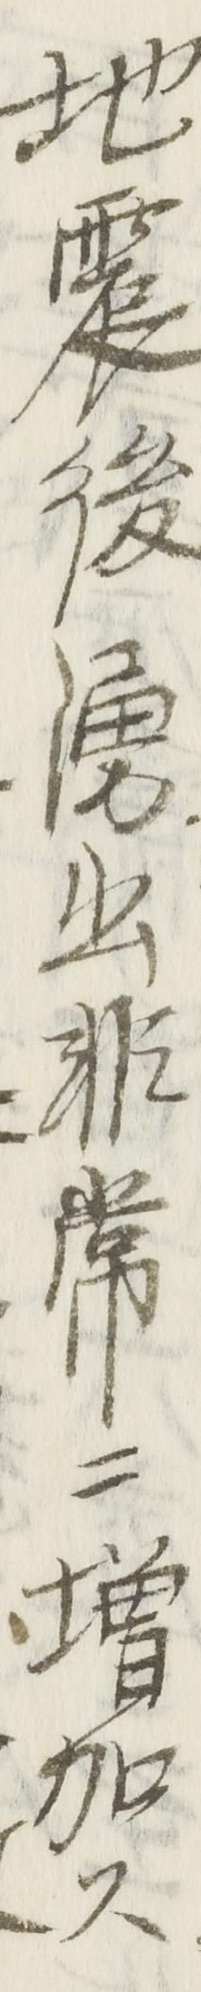地震後湧出非常二増加ス
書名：温冷泉試験表
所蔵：東京大学地震研究所図書室 Earthquake Research Institute Library, The University of Tokyo, JAPAN
